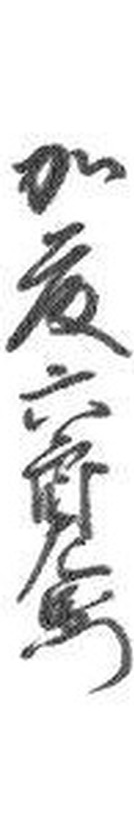加藤六郎左衛門
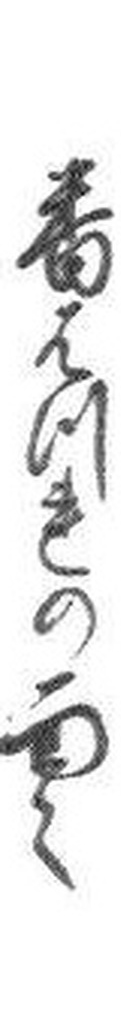番はつれの面々
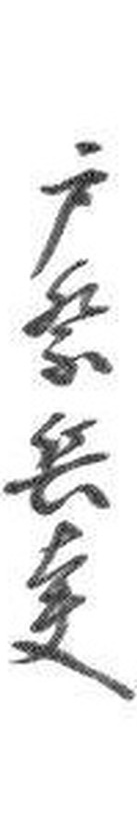戸祭兵太夫
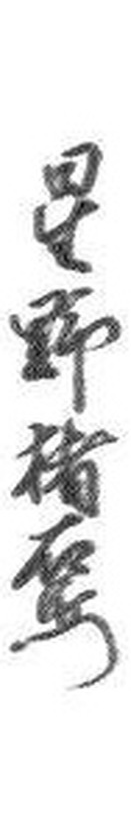星野猪右衛門
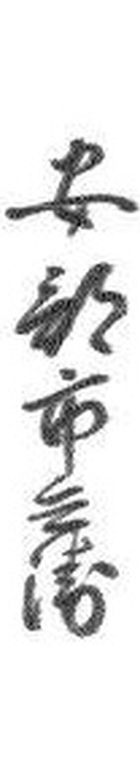安部市兵衛
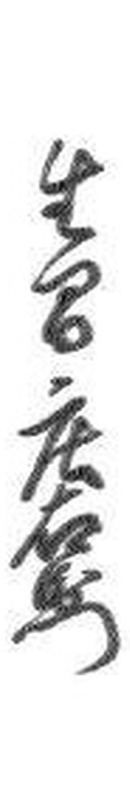生間庄右衛門

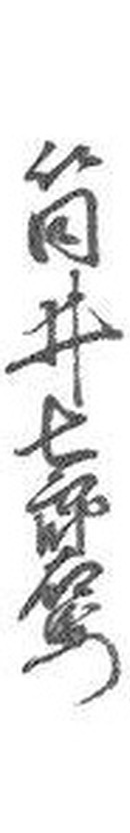筒井七郎右衛門
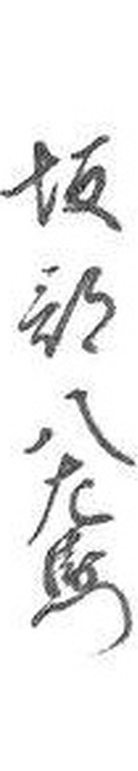坂部八左衛門
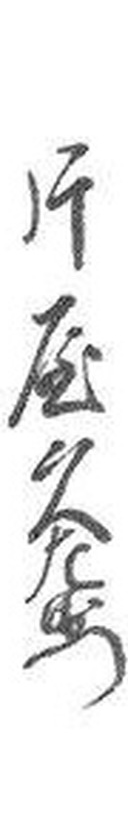片屋久左衛門
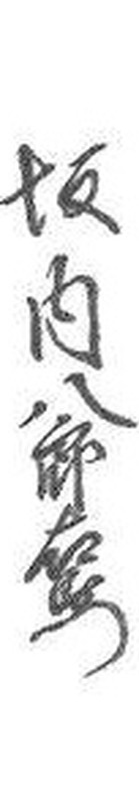坂内八郎右衛門
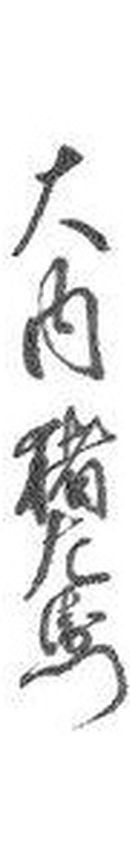大内猪左衛門
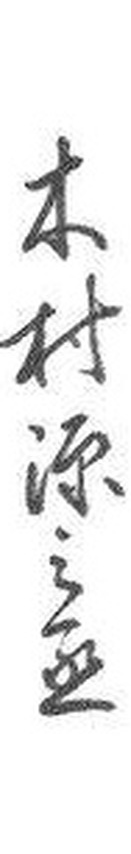木村源之丞
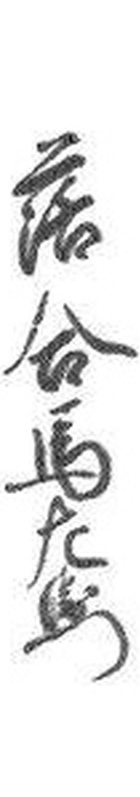落合馬左衛門
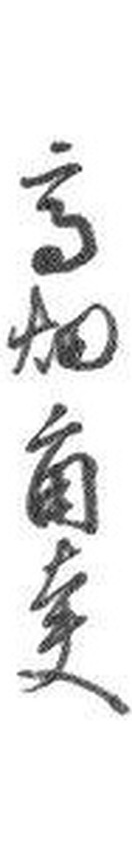高畑角太夫
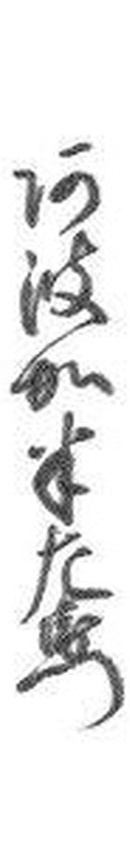阿波加半左衛門
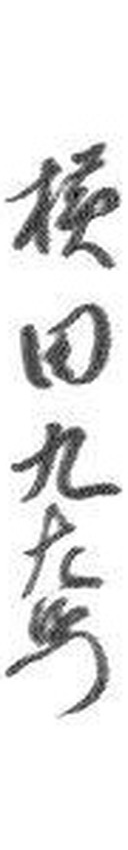横田九左衛門
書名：家譜 四 忠昌公 従寛永七年到正保四年
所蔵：福井県文書館 Fukui Prefectural Archives
